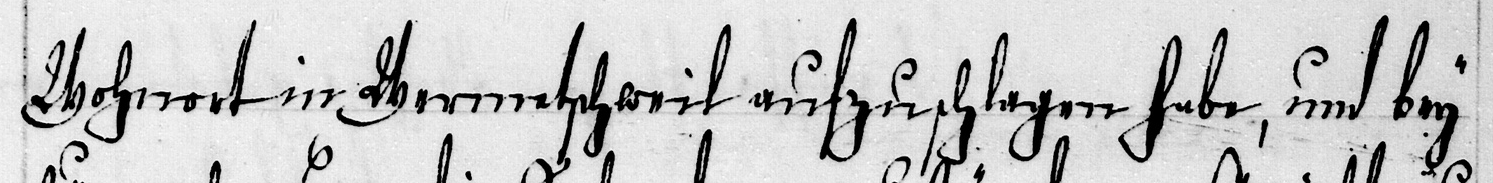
Wohnort in Wermetschweil aufzuschlagen habe, und bey
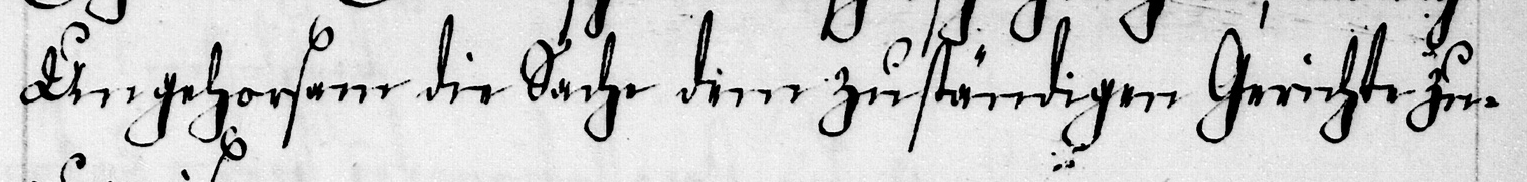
Ungehorsam die Sache dem zuständigen Gerichte zu¬
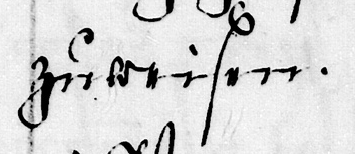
zuweisen.
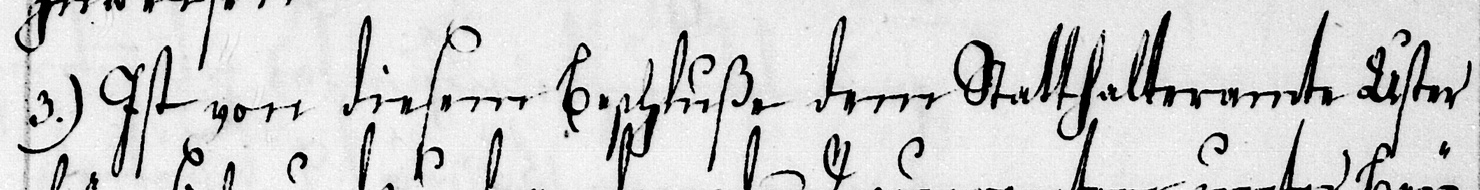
3.) Ist von diesem Beschluße dem Statthalteramte Uster
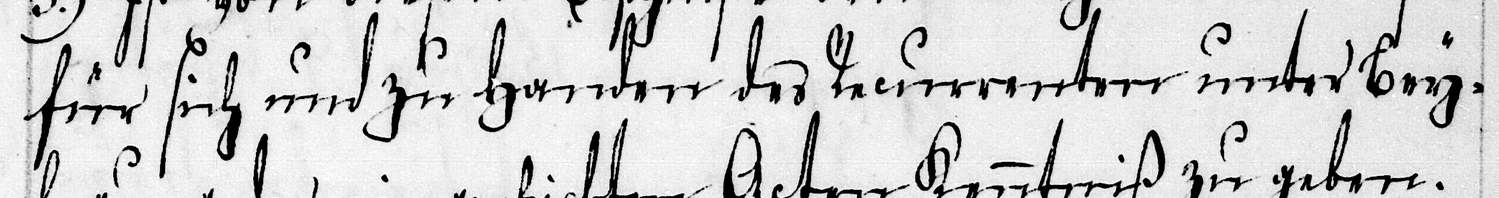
für sich und zu Handen des Recurrenten unter Bey¬
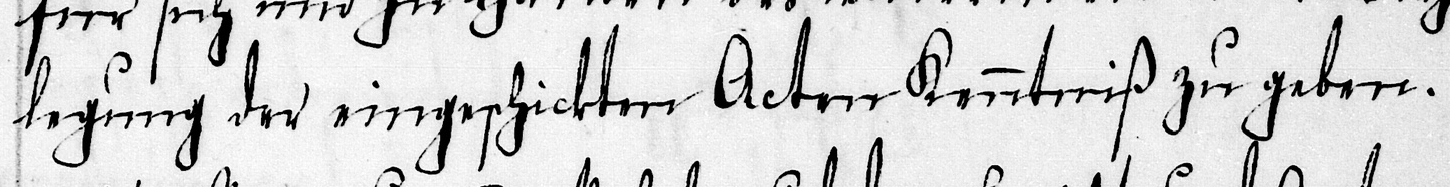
legung der eingeschickten Acten Kenntniß zu geben.
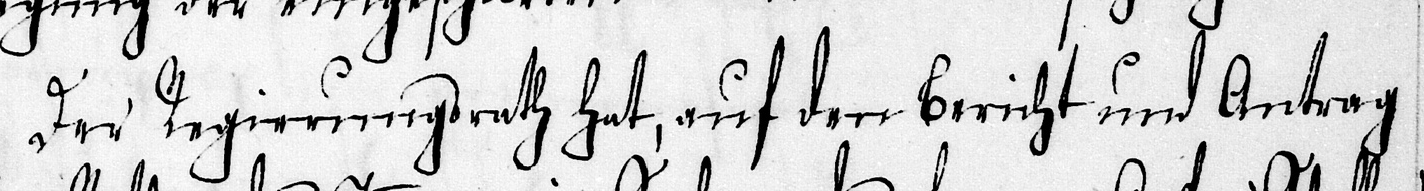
Der Regierungsrath hat, auf den Bericht und Antrag
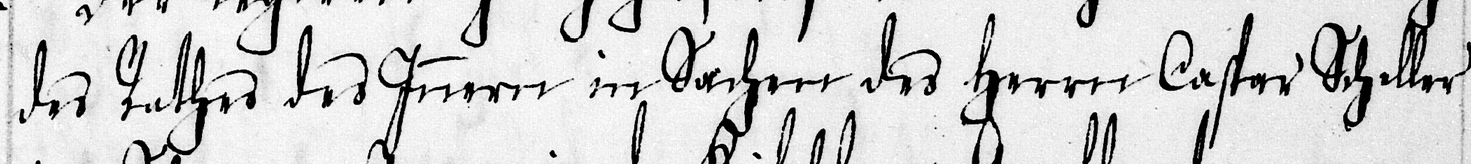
des Rathes des Innern in Sachen des Herrn Caspar Scheller
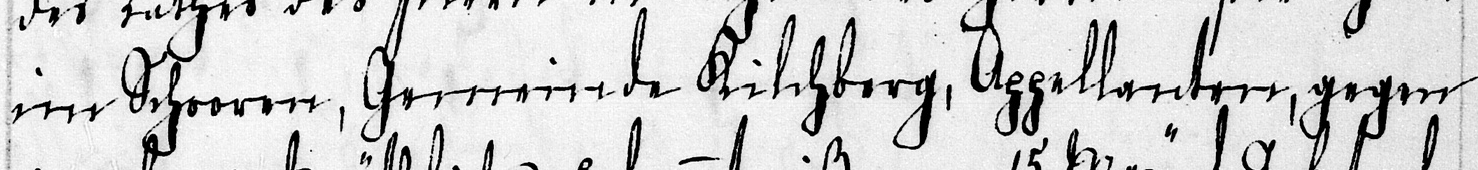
im Schooren, Gemeinde Kilchberg, Appellanten, gegen
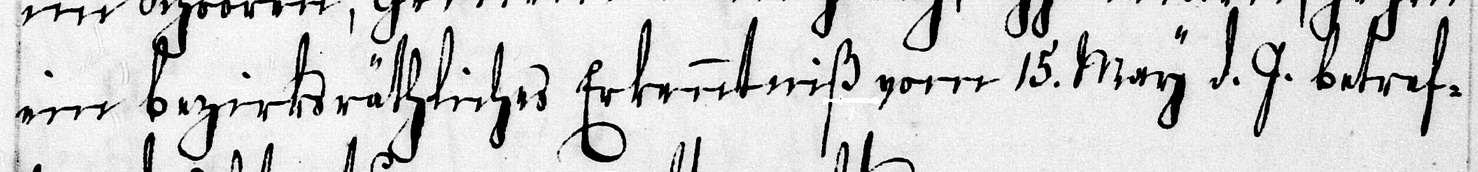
ein bezirksräthliches Erkenntniß, vom 15. May d. J. betref¬
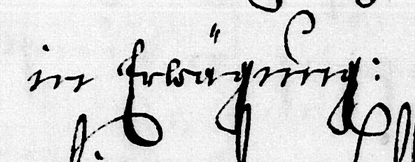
in Erwägung:
